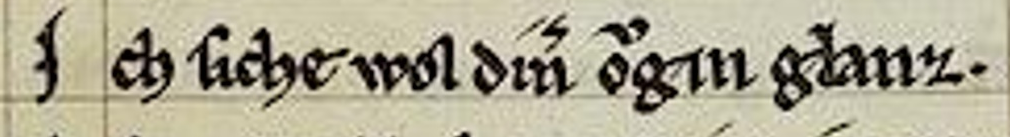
Ich ſiche wol din(er) o°vgin glanz.
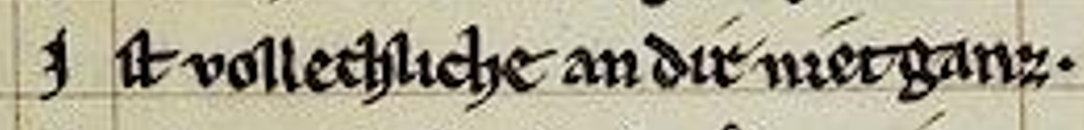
Iſt vollechliche an dir niet ganz.
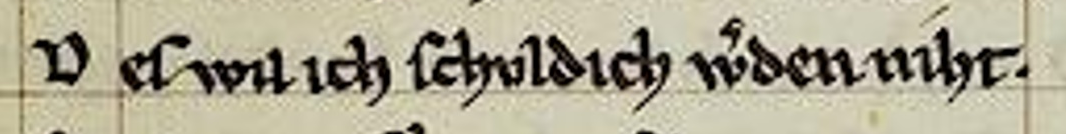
Deſ wil ich ſchuldich w(er)den niht.
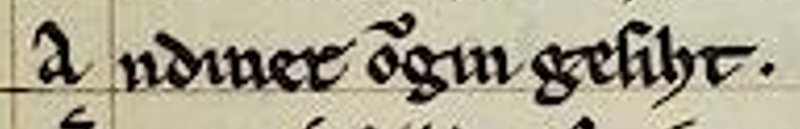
Andiner o°vgin geſiht.
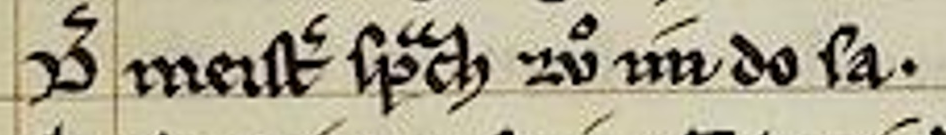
D(er) meiſt(er) ſp(ra)ch zv°o im do ſa.
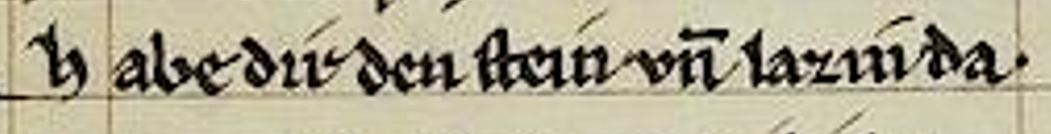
Habe dir den ſtein vn(d) lazin da.
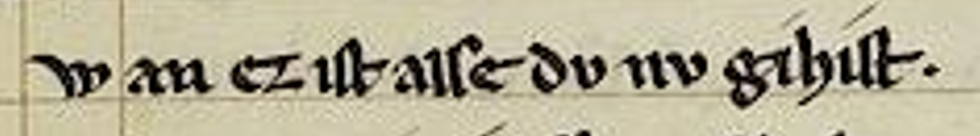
Wan ez iſt alſe dv nv gihiſt.
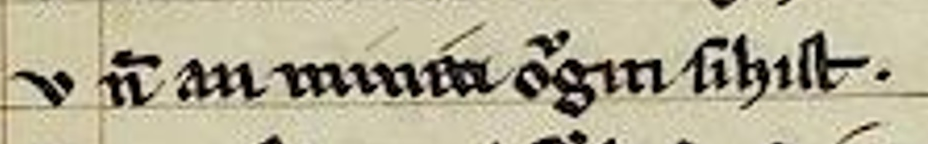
Vn(d) an minen o°vgin ſihiſt.
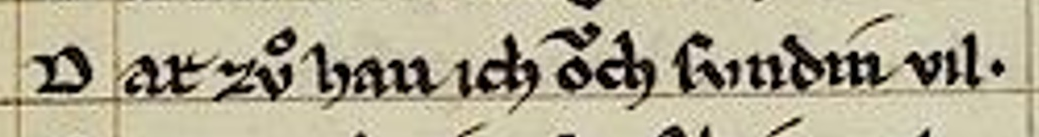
Dar zv°o han ich o°vch ſvndin vil.
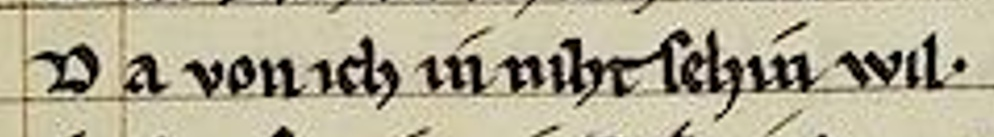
Da von ich in niht ſehin wil.
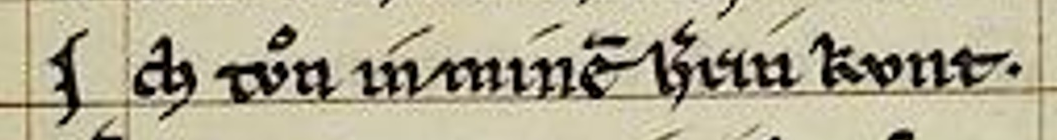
Ich tv°on in mine(m) h(er)rin kvnt.
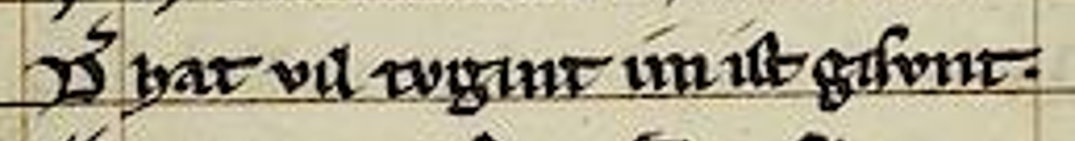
D(er) hat vil tvgint im iſt giſvnt.
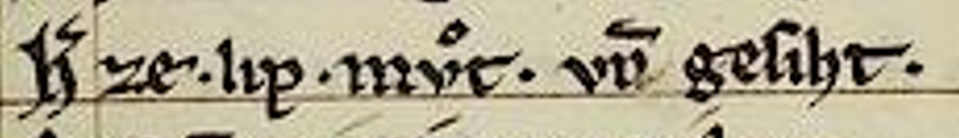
H(er)ze. lip. mv°ot. vn(d) geſiht.
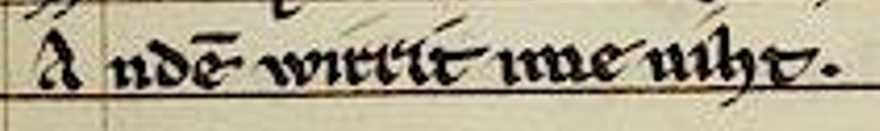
Ande(m) wirrit ime niht.
